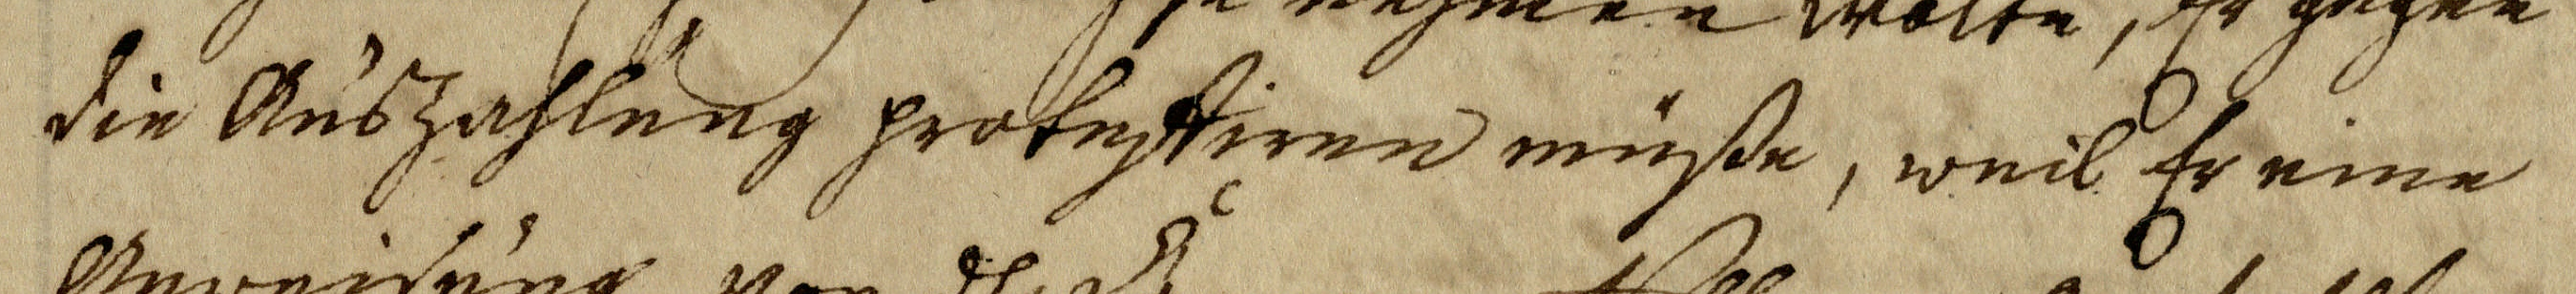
die Auszahlung protestiren müße, weil Er eine
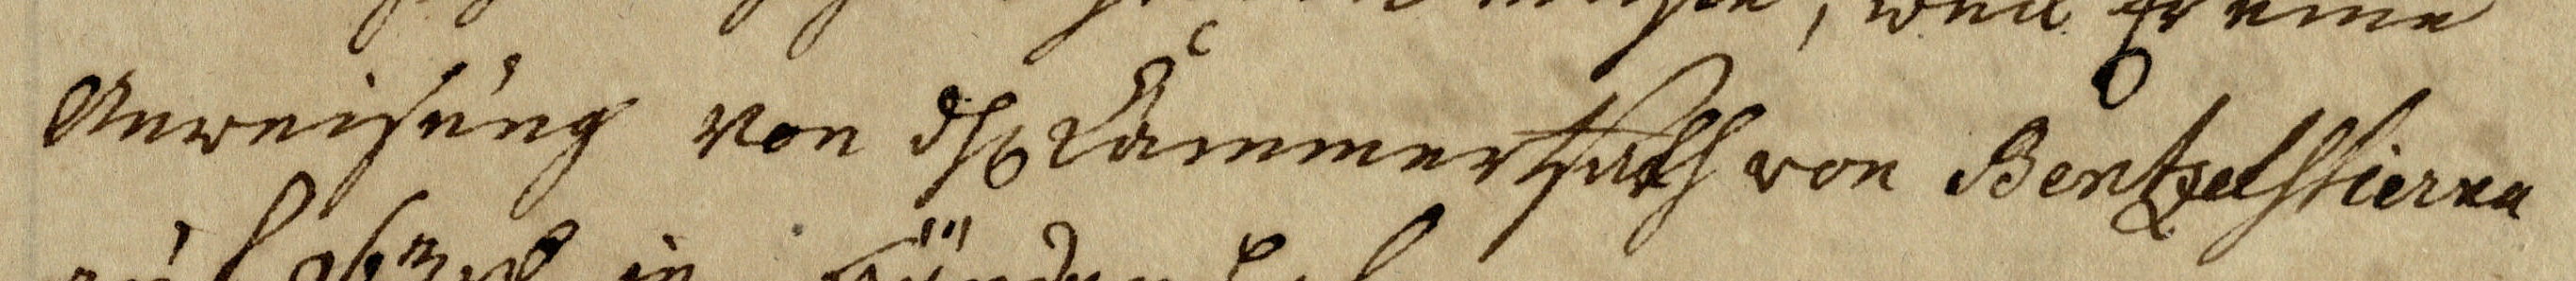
Anweisung von dh. CammertRath von Bentzelstierna
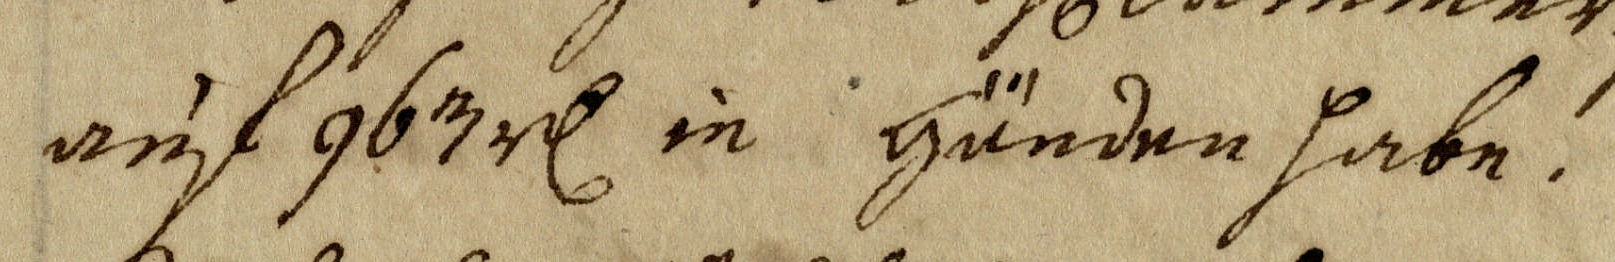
auf 963 rt. in Händen habe.
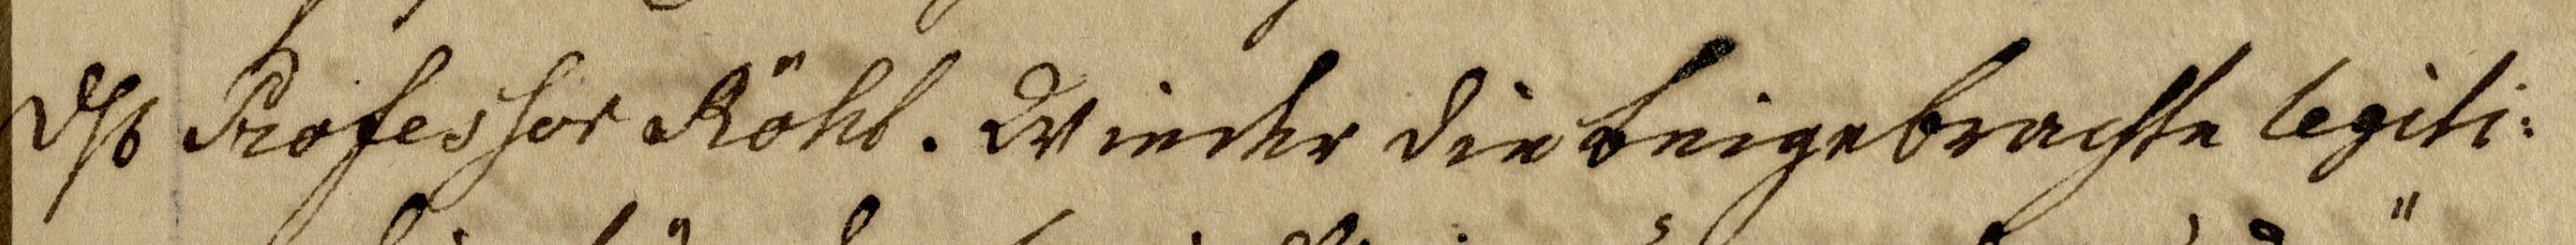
dh Professor Röhl. Wieder die beigebrachte legiti¬
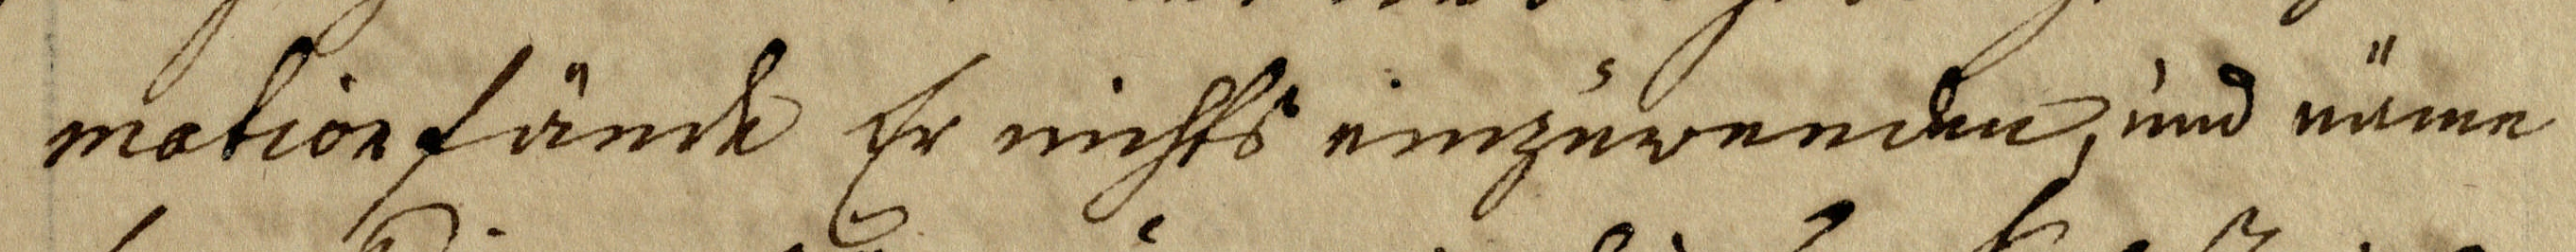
mation fände Er nichts einzuwenden und näme
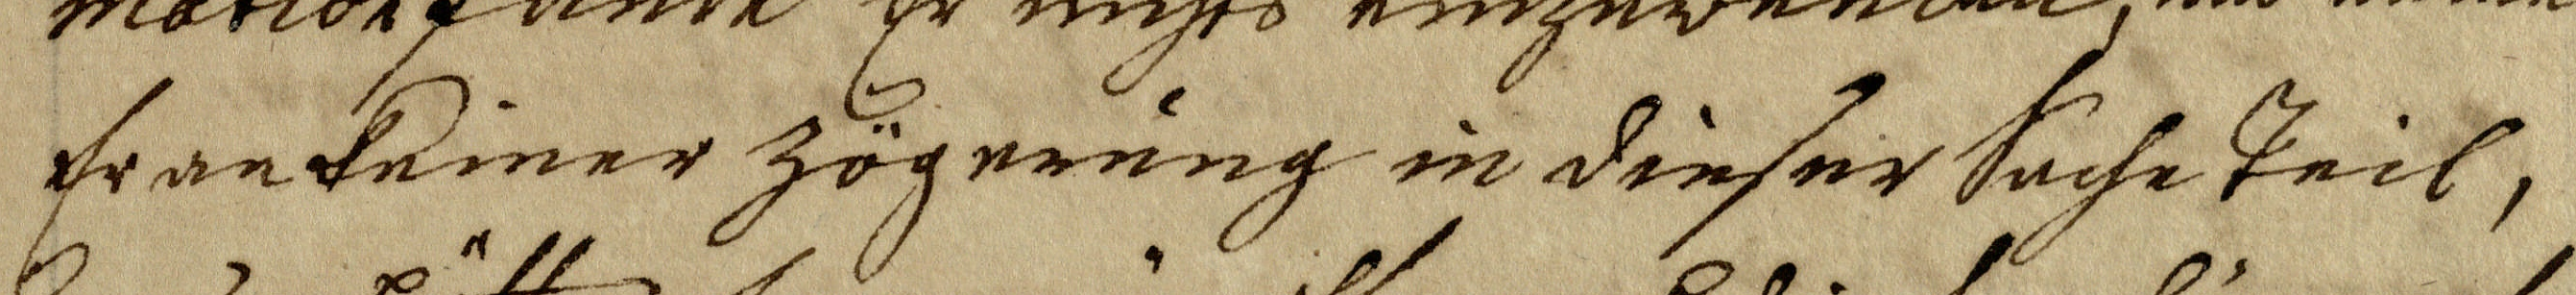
Er an keiner Zögerung im dieser Sache Teil,
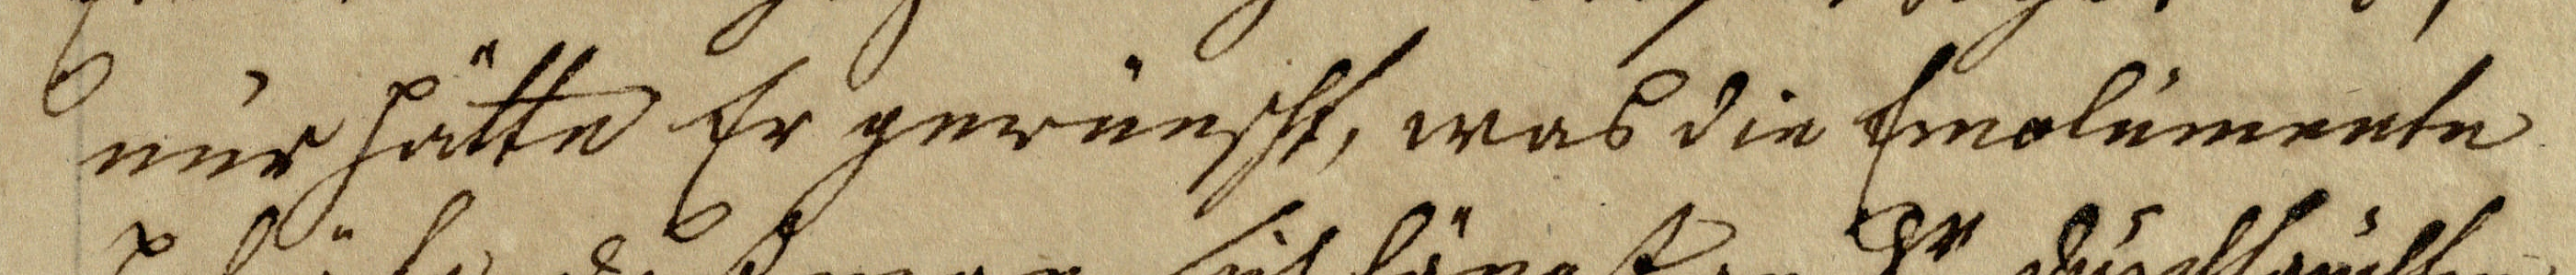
nur hätte Er gewünscht, was die Emolumente
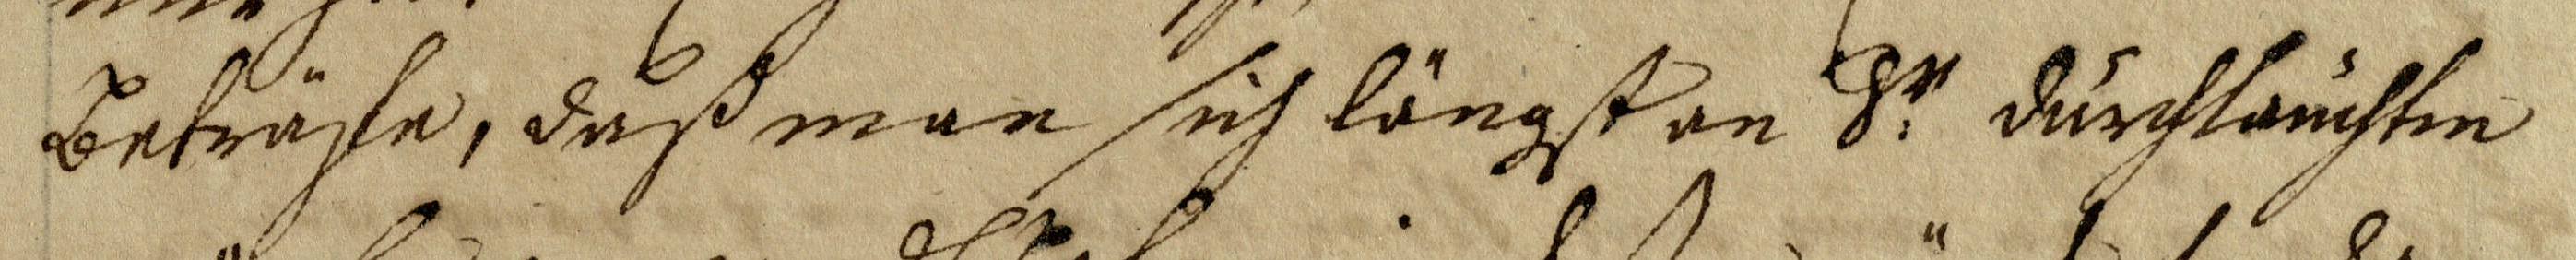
beträfe, daß man sich längst an Sr Durchlauchten
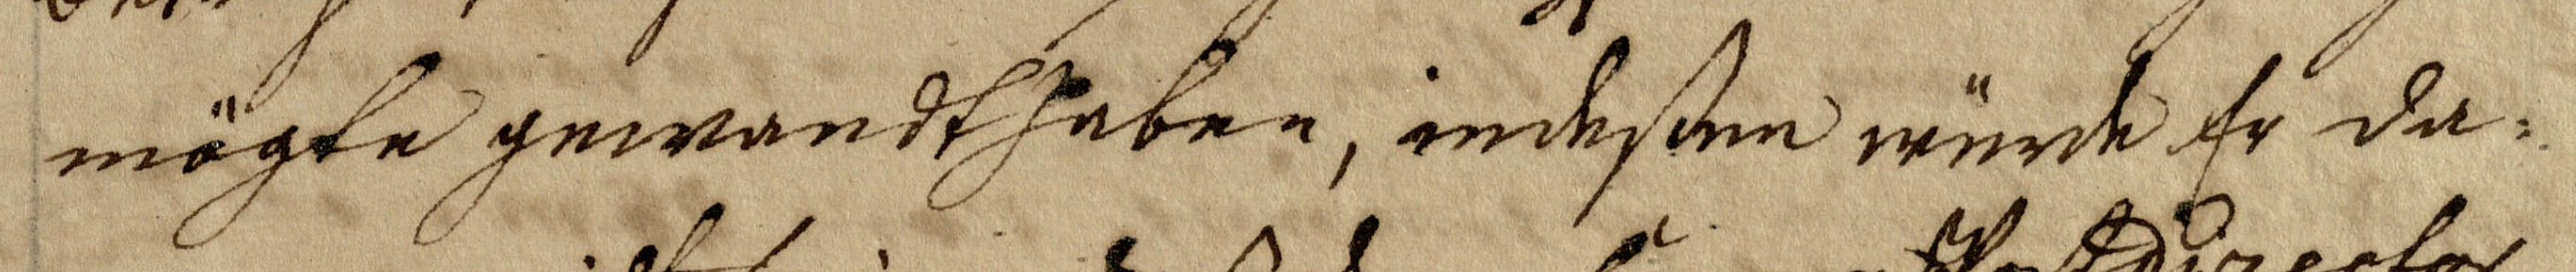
mögte gewandt haben, indessen würde Er da¬
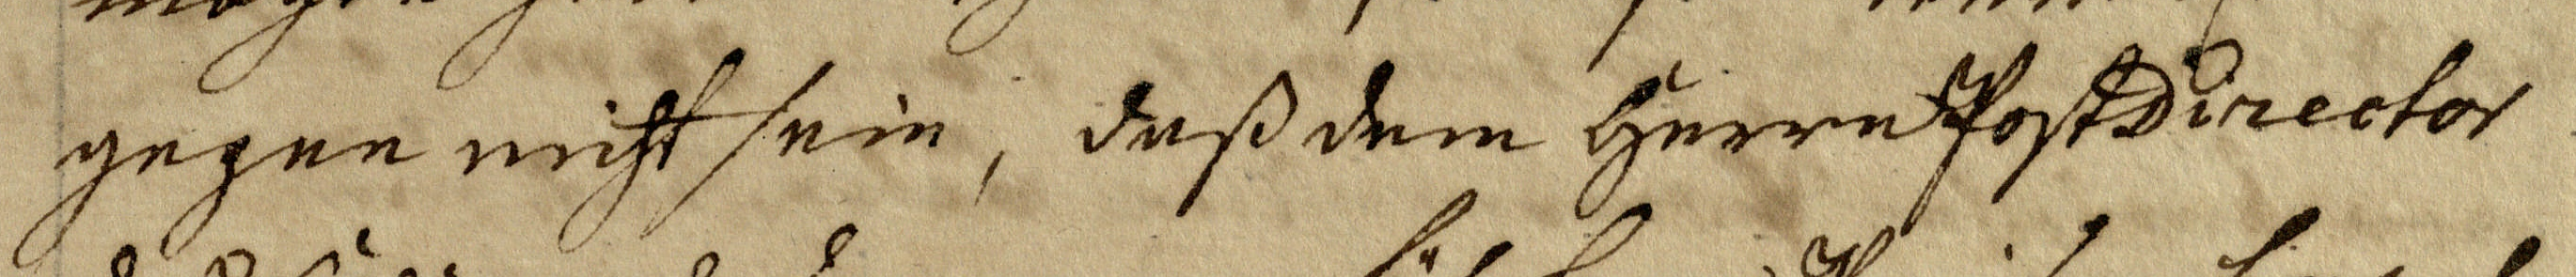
gegen nicht sein, daß dem Herrn PostDirector
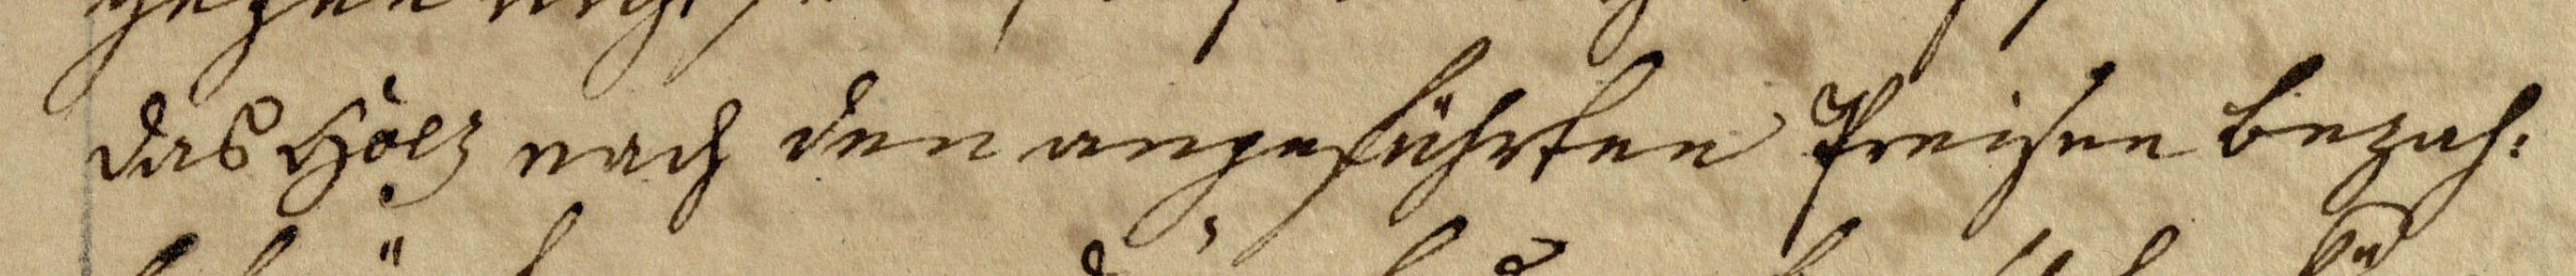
das Holz nach den angeführten Preisen bezah¬
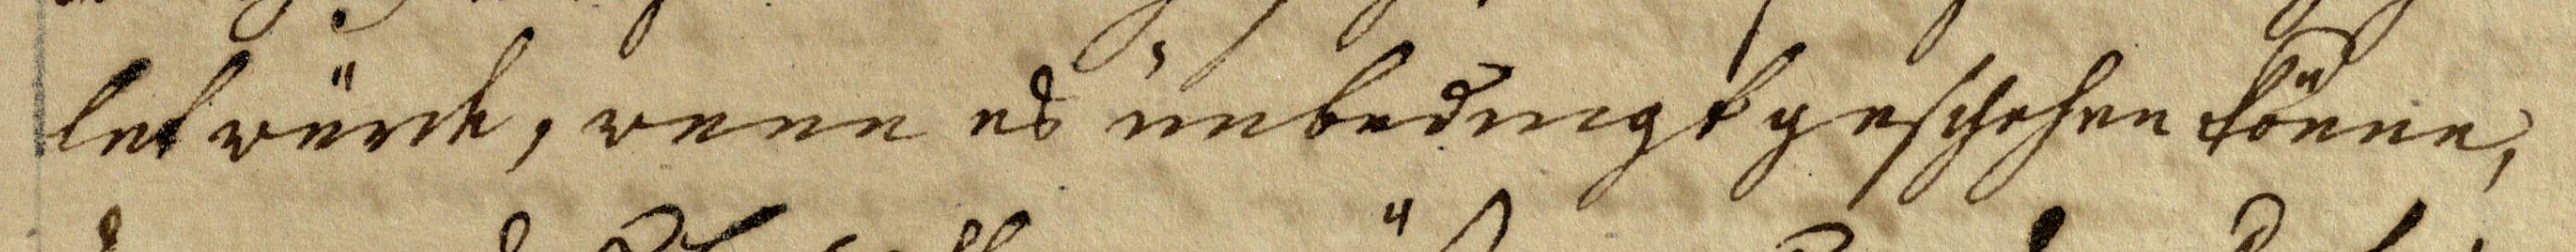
let würde, wenn es unbedingt geschehen könne,
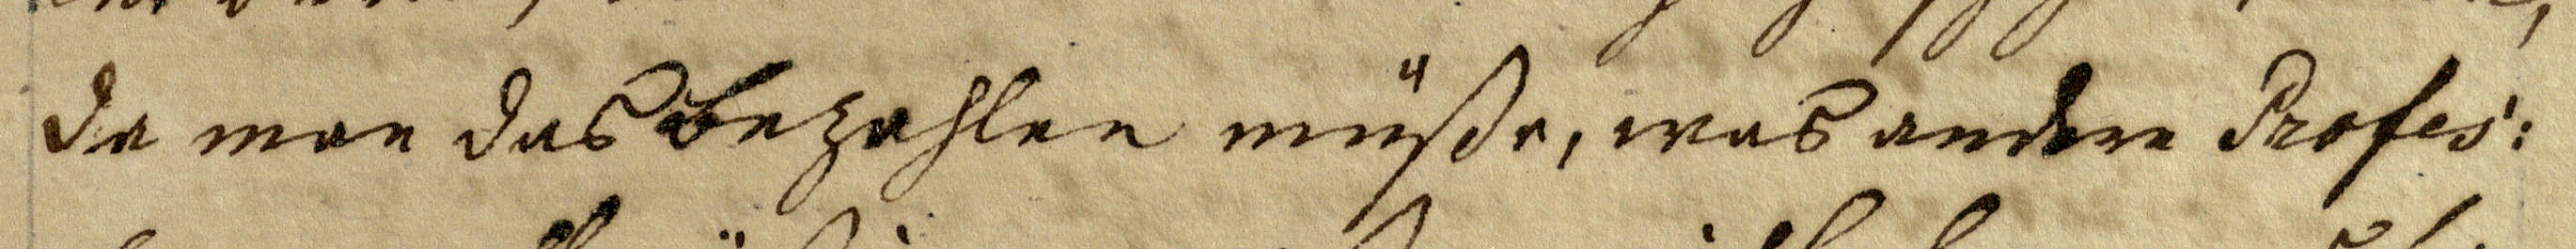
Da man das bezahlen müße, was andere Profes¬
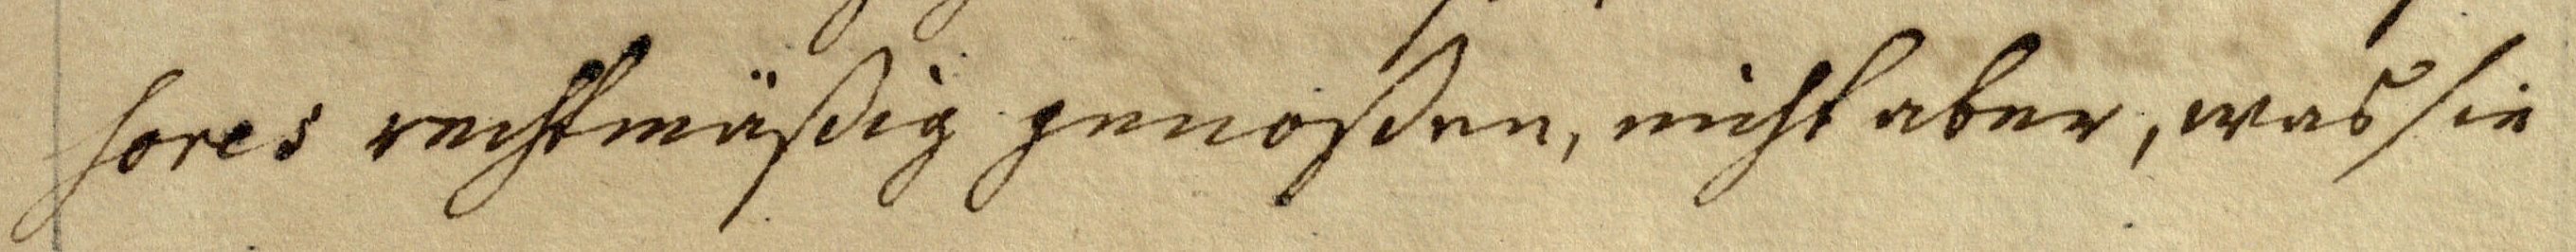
sores rechtmäßig genoßen, nicht aber, was sie
